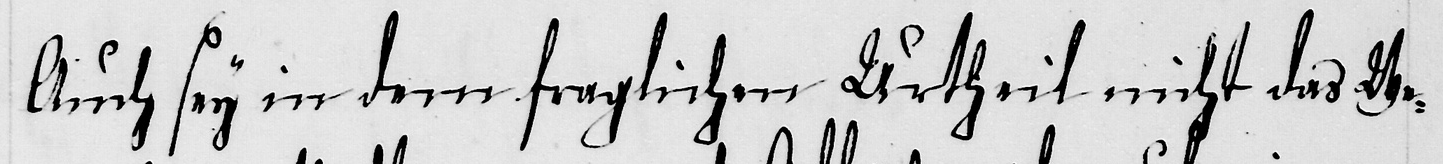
Auch sey in dem fraglichen Urtheil nicht das We¬
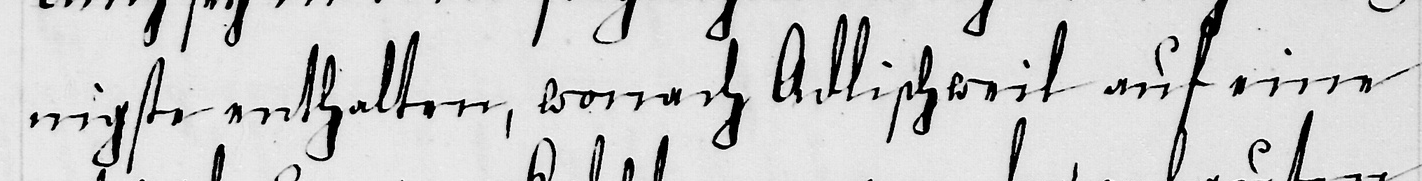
nigste enthalten, wonach Adlischweil auf eine
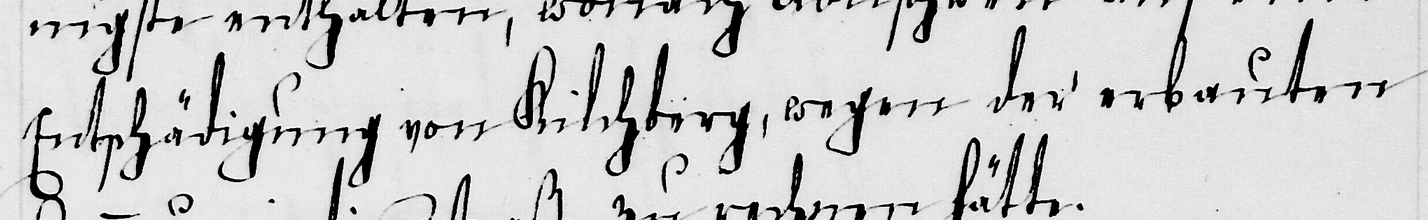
Entschädigung von Kilchberg, wegen der erbauten
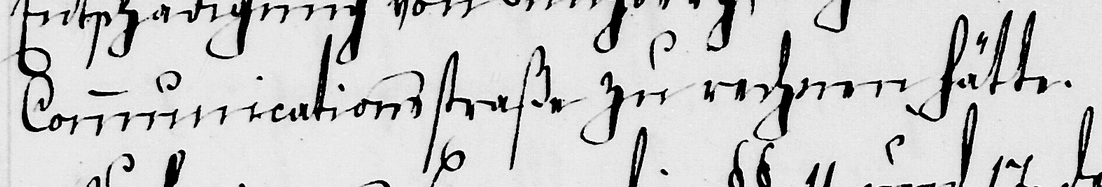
Communicationsstraße zu rechnen hätte.
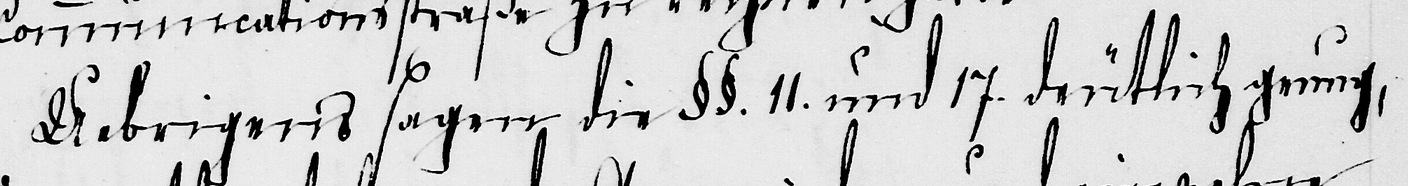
Uebrigens sagen die §§. 11. und 17. deutlich genug,
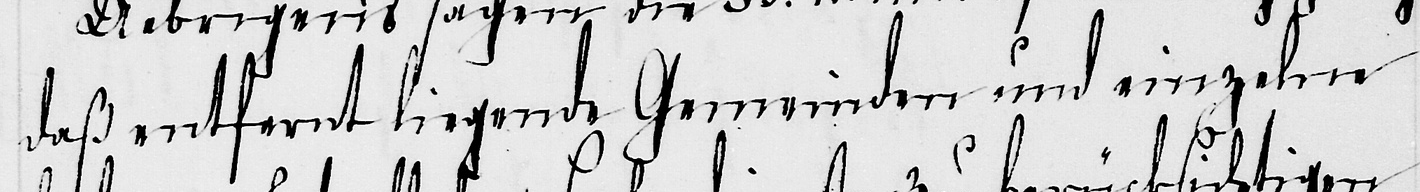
daß entfernt liegende Gemeinden und einzelne
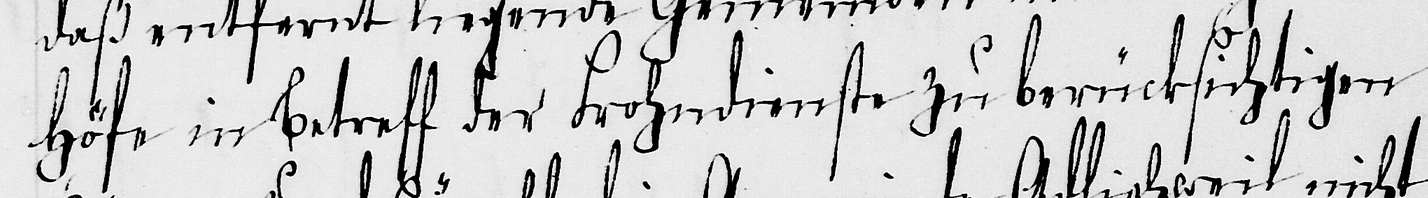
Höfe in Betreff der Frohndienste zu berücksichtigen
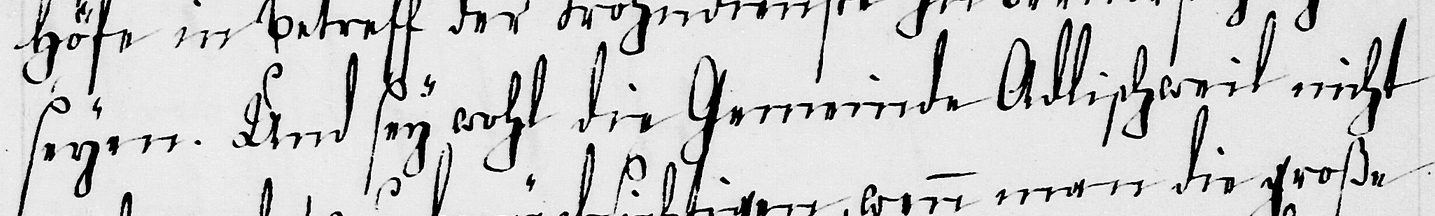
seyen. Und sey wohl die Gemeinde Adlischweil nicht
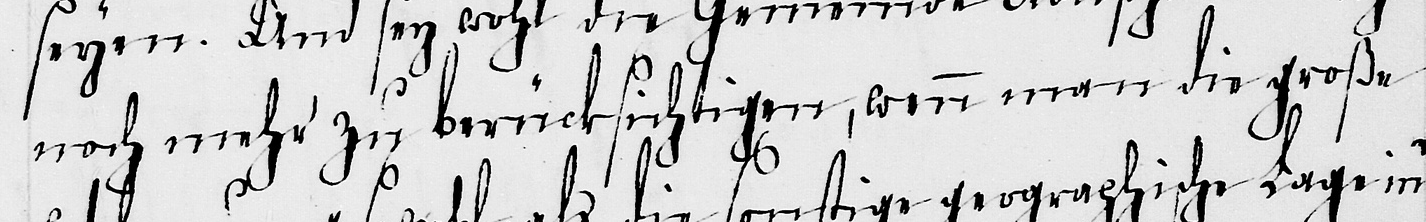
noch mehr zu berücksichtigen, wenn man die große
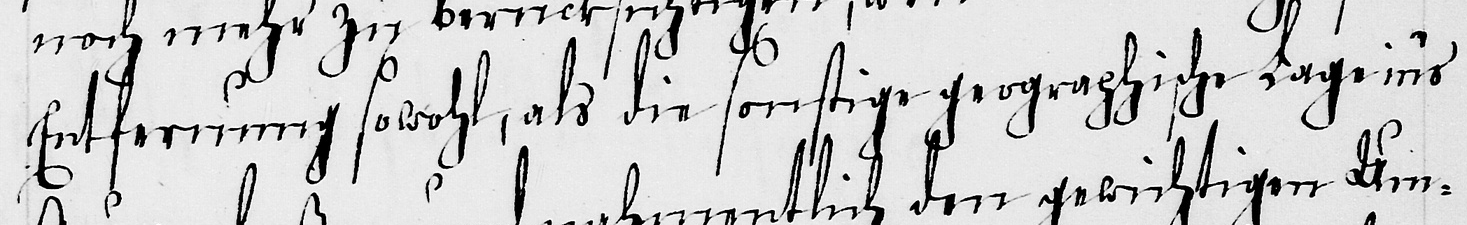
Entfernung sowohl, als die Sonstige geographische Lage ins
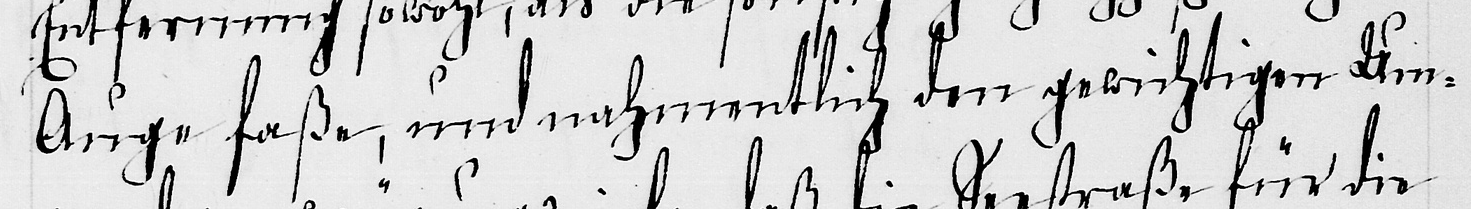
Auge faße, und nahmentlich den gewichtigen Um¬
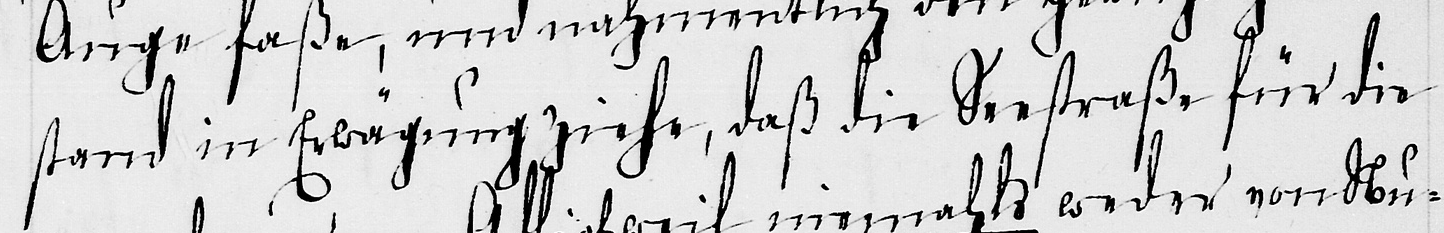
stand in Erwägung ziehe, daß die Seestraße für die
